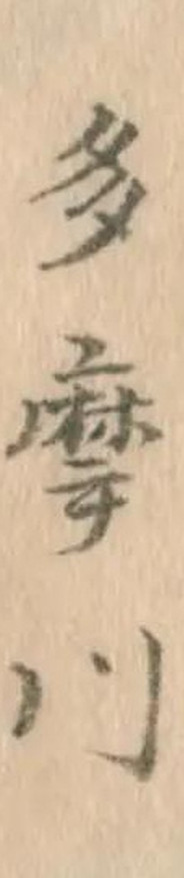多摩川
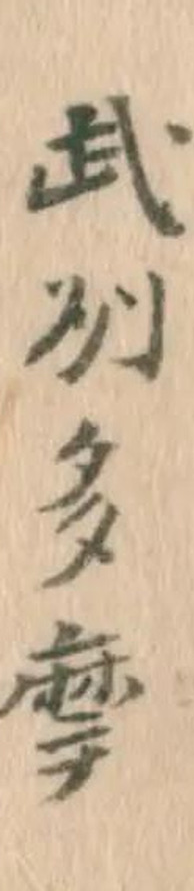武州多摩
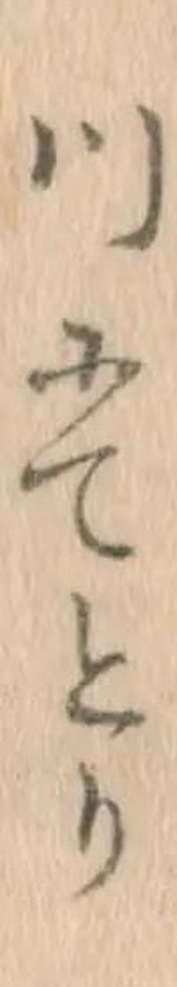川にてとり
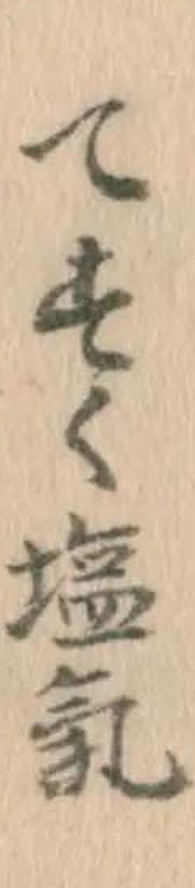てすく塩気
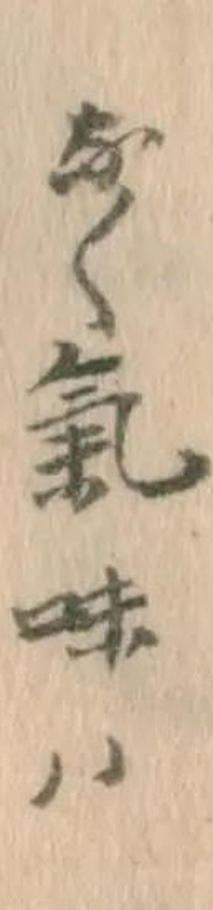なく気味は
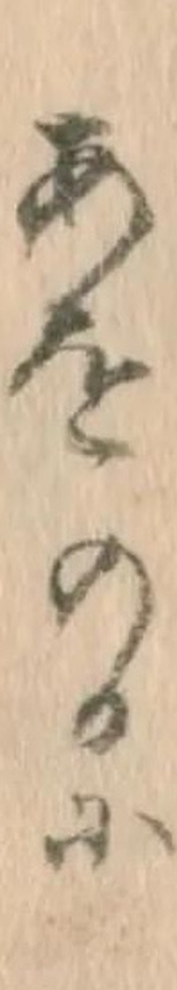あをのりに
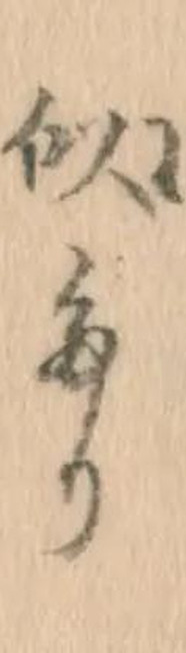似たり
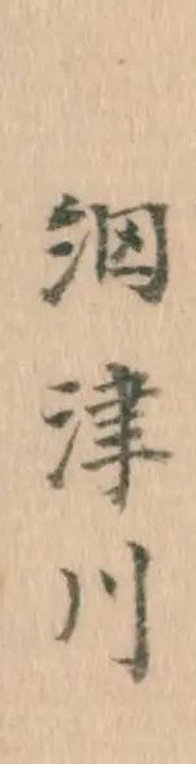細津川
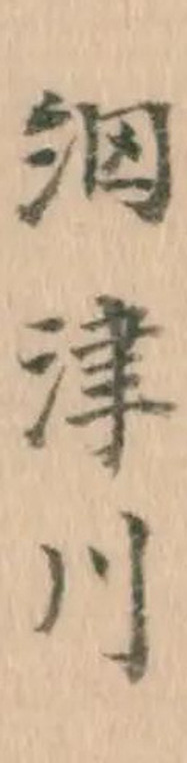細津川
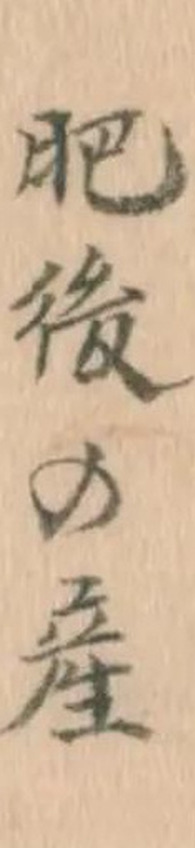肥後の産

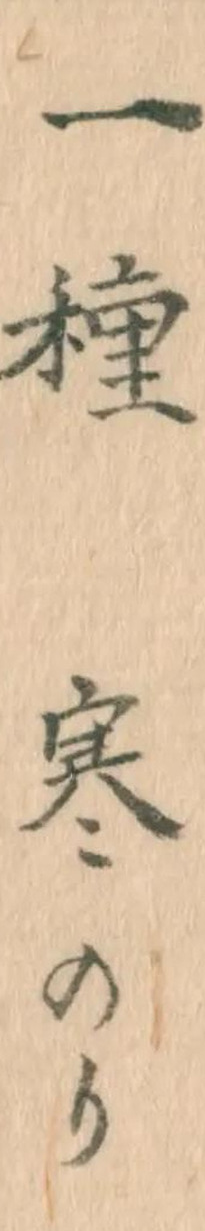一種寒のり
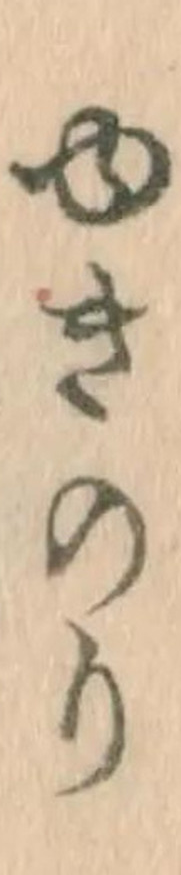ゆきのり
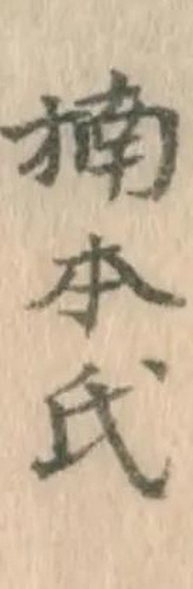楠本氏
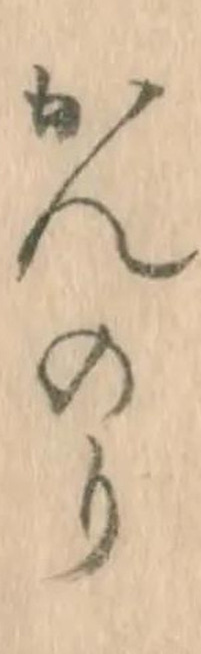かんのり
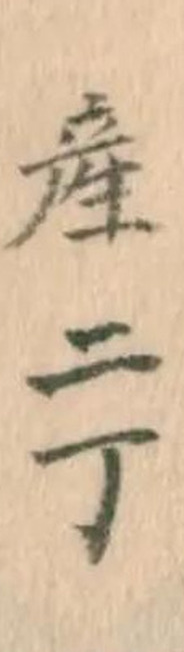産二丁
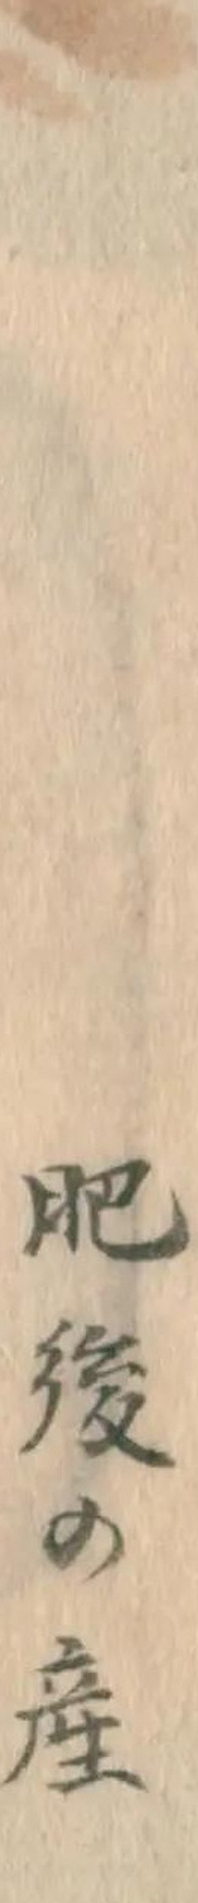肥後の産
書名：本草図譜. 巻52-54
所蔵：国立国会図書館 National Diet Library, JAPAN
